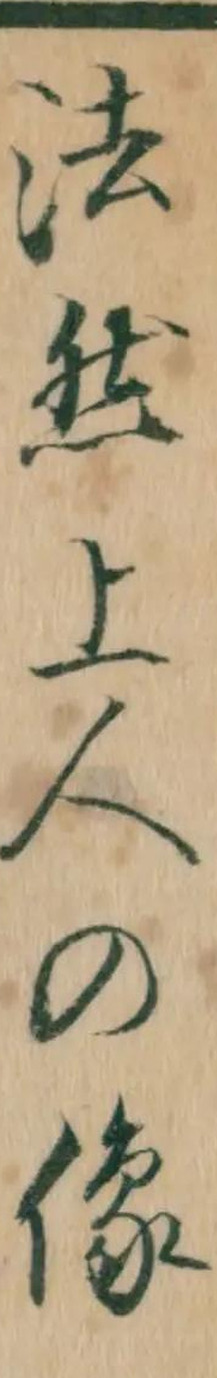法然上人の像
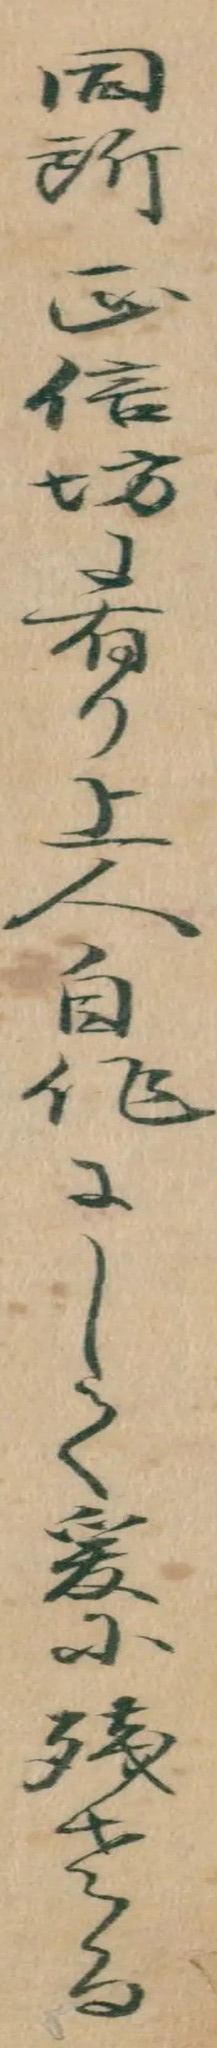同所正信坊に有り上人自作にして爰に残さる
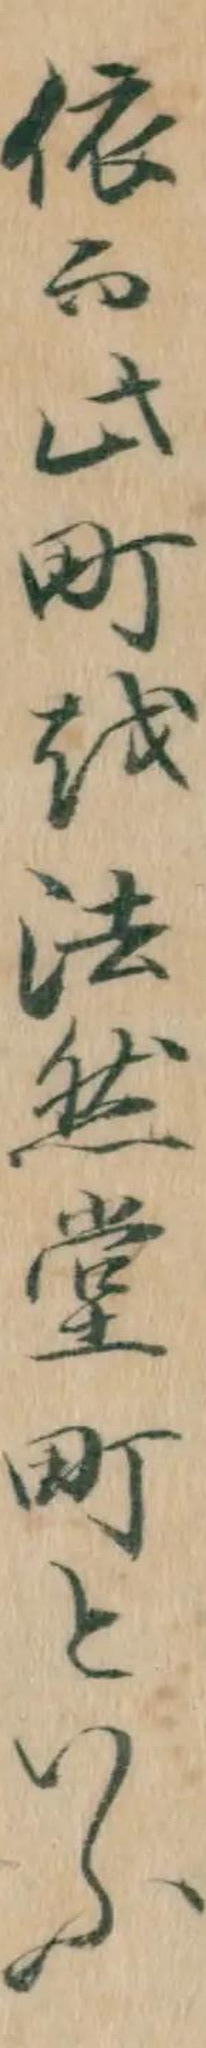依て此町を法然堂町といふ
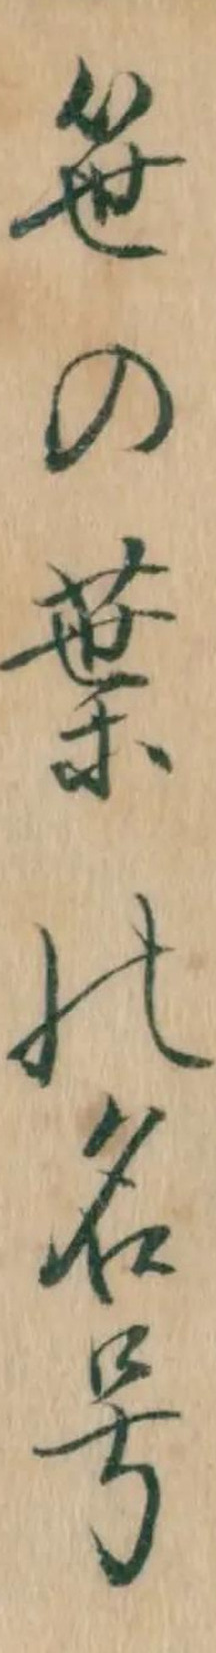笹の葉の名号
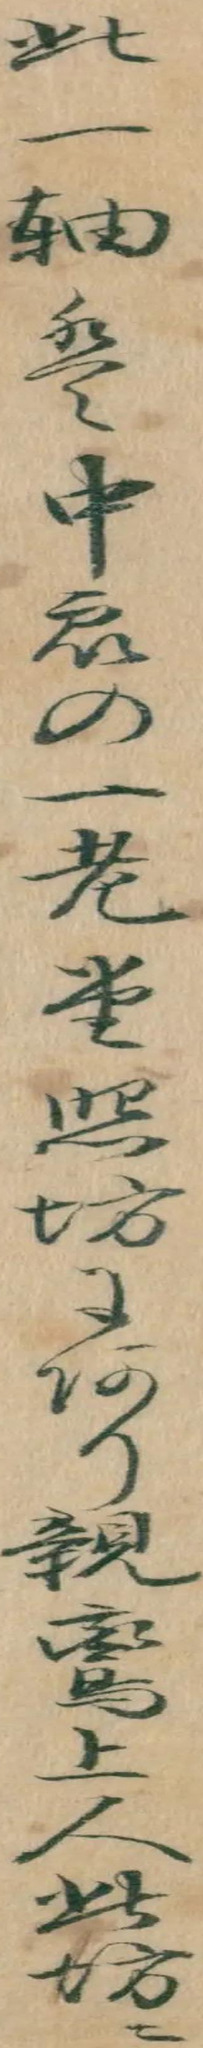此一軸は中衆の一老堂照坊にあり親鸞上人此坊に
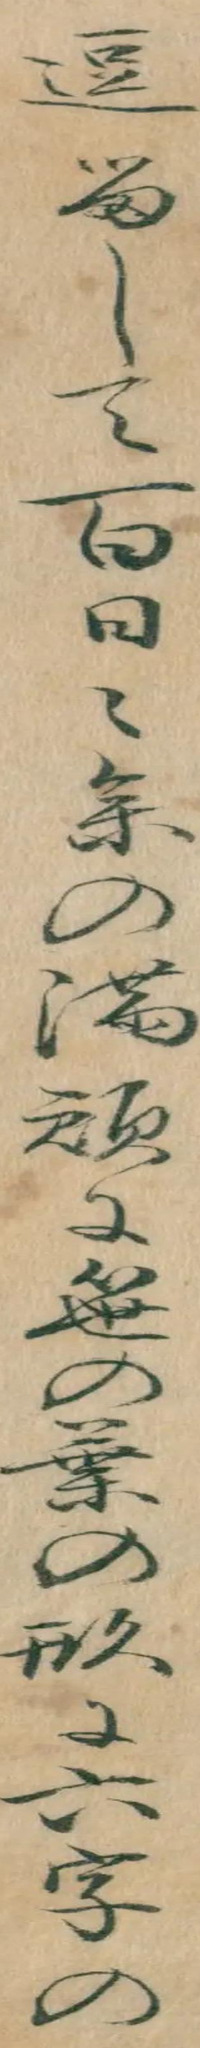逗留して百日々参の満願に笹の葉の形に六字の
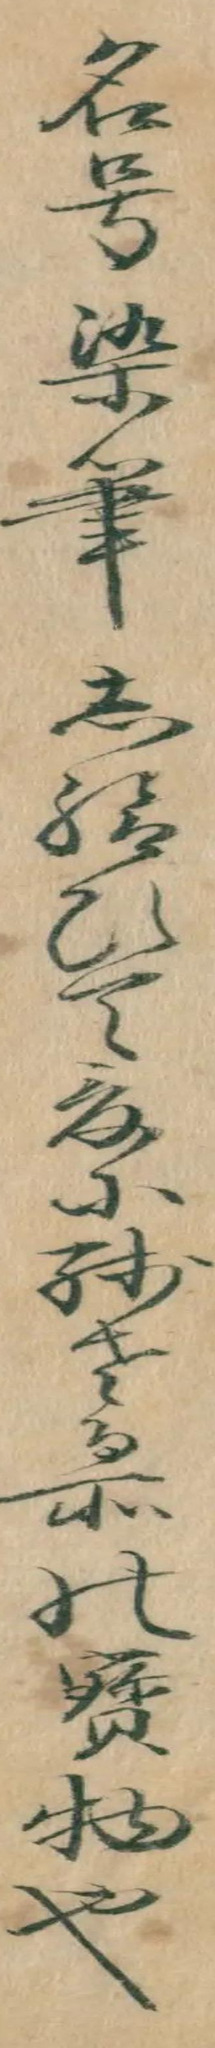名号染筆し給ひて爰に残さる所の寶物也
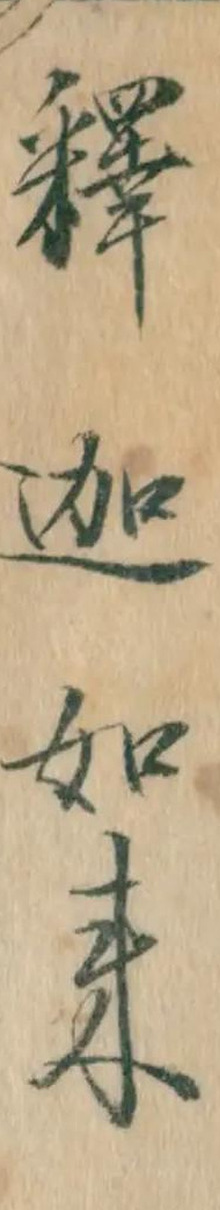釋迦如来
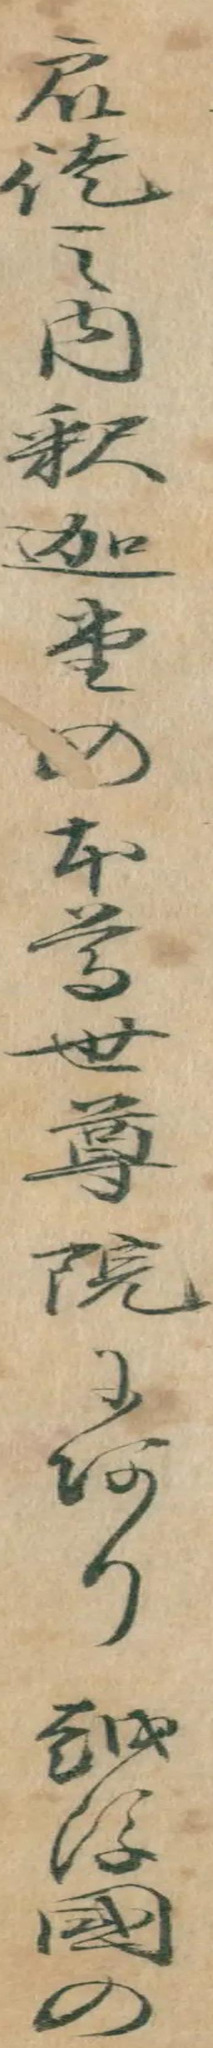衆徒之内釈迦堂の本尊世尊院にあり越後國の
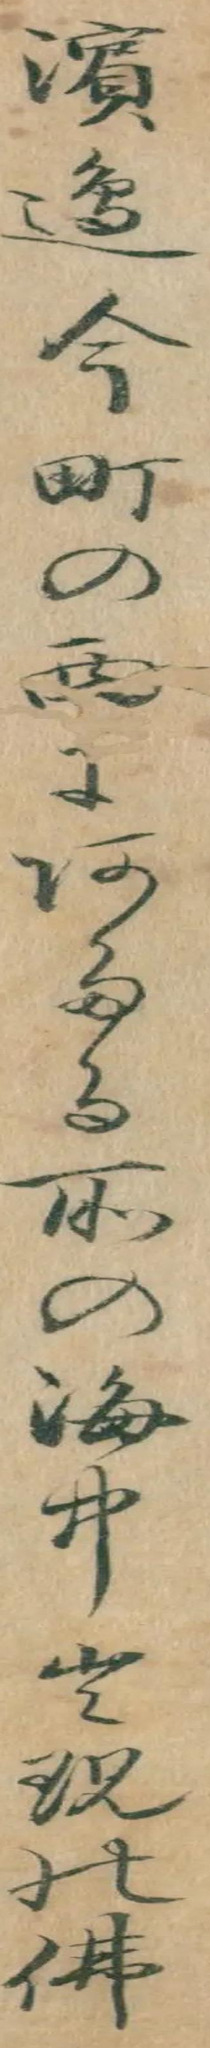濱邊今町の西にあたる所の海中出現の佛
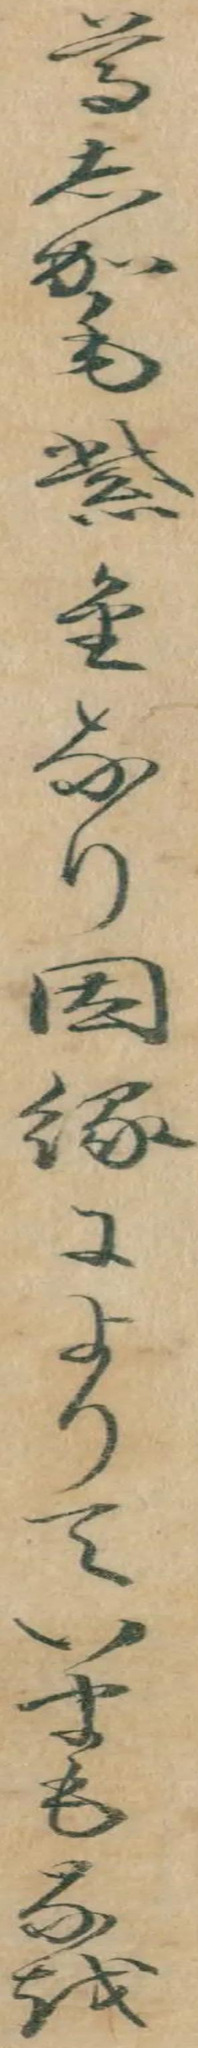尊しかも紫金なり因縁によりていまもなを

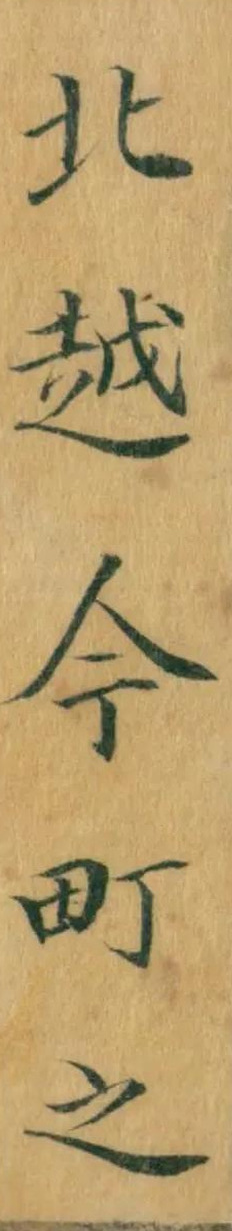北越今町之
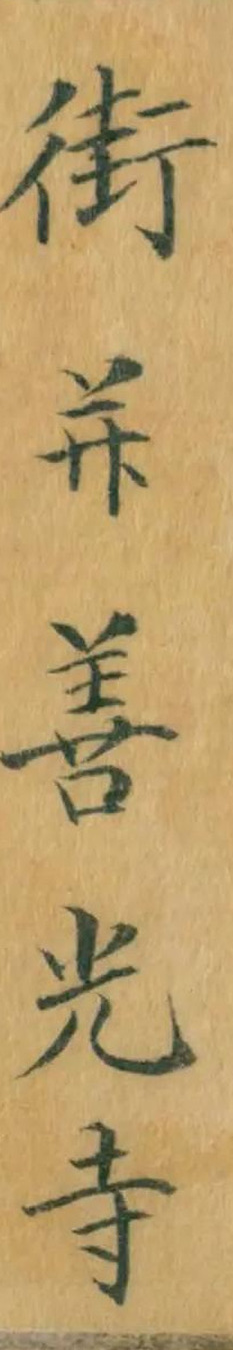街并善光寺
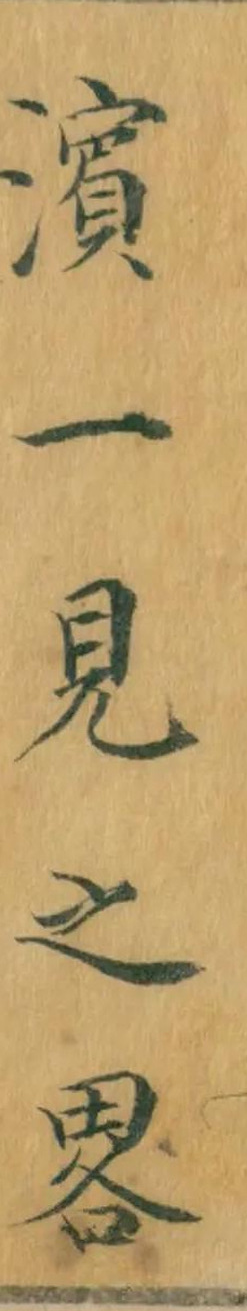濱一見之畧

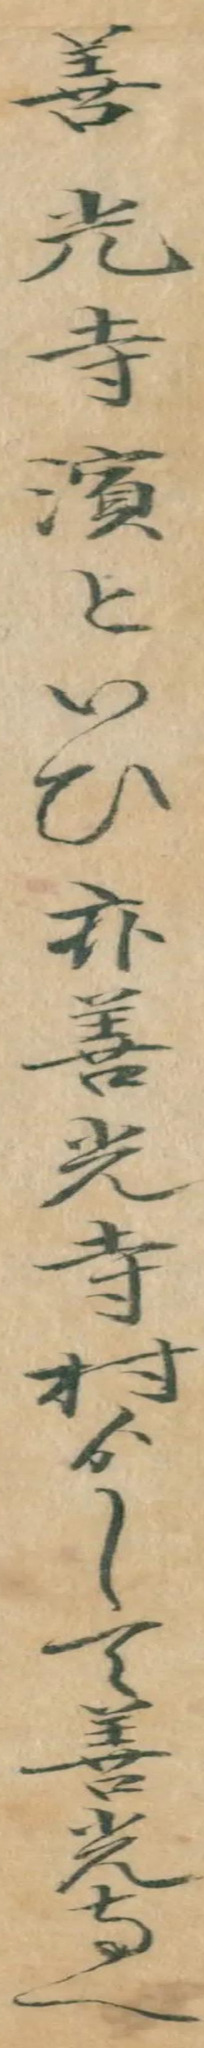善光寺濱といひ亦善光寺村ゟして善光寺へ
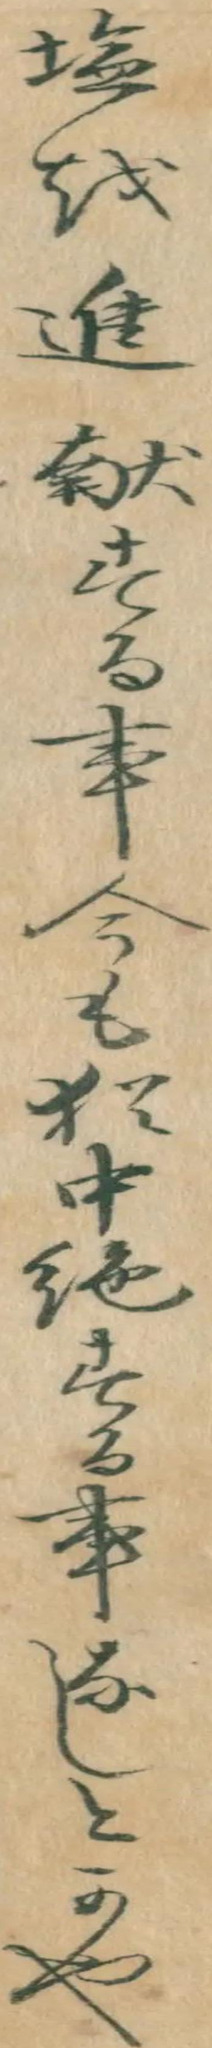塩を進献する事今も猶中絶する事なしとかや
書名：俗語之種. [7]
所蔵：国立国会図書館 National Diet Library, JAPAN
